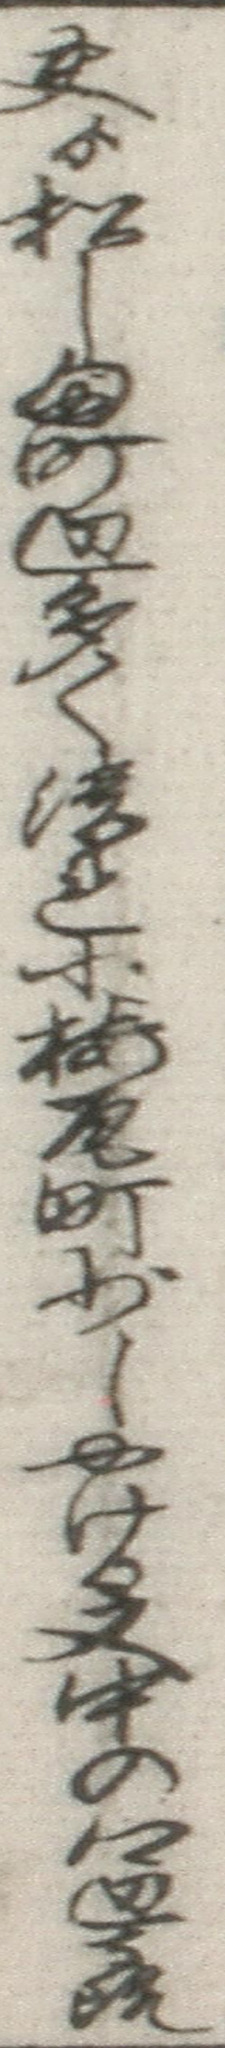夫ゟ松しま町辺多く潰れ小梅瓦町少しやける又中の郷辺寺院
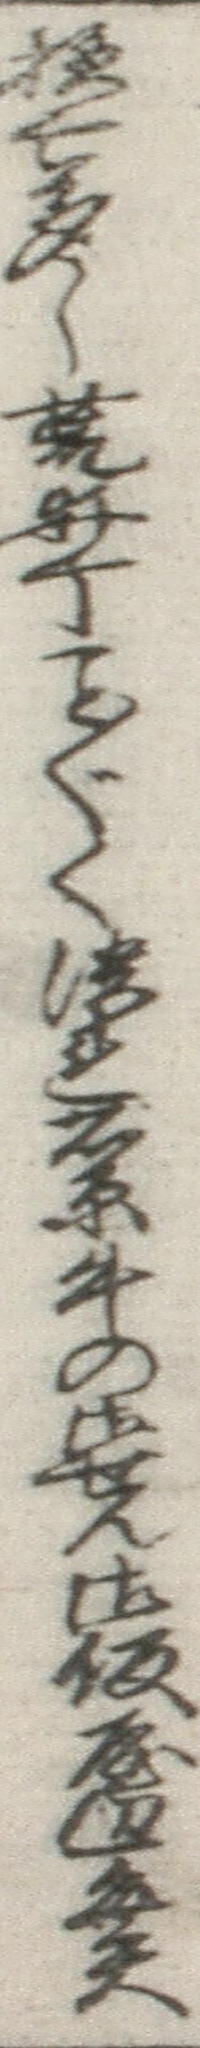損亡多し荒井丁こと〴〵く潰れ石原牛の御せん御仮屋辺弁天
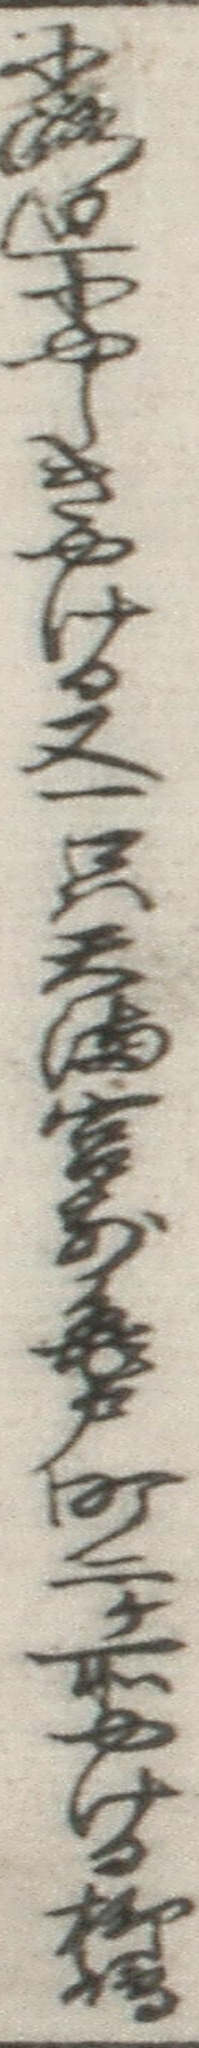小路辺小やしきやける又一口は天満宮前亀戸町二ケ所やける柳嶋
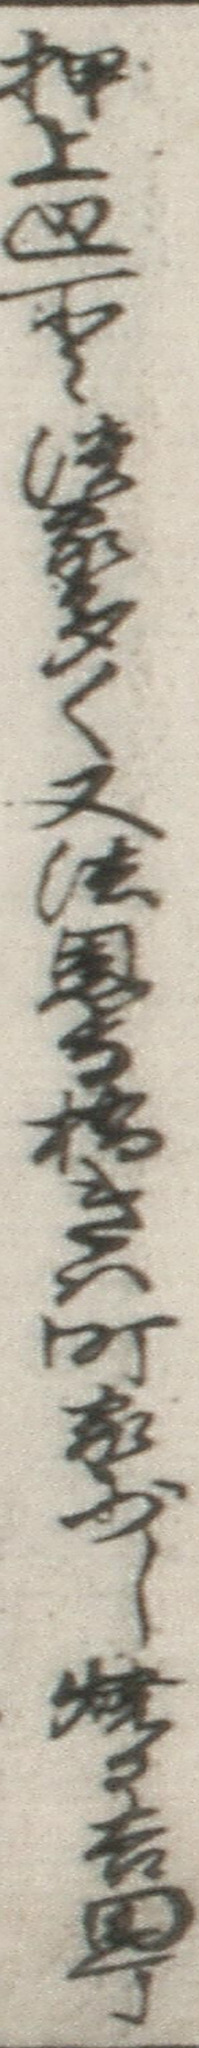押上辺所〻潰家多く又法恩寺橋きは町家少し焼る吉田丁
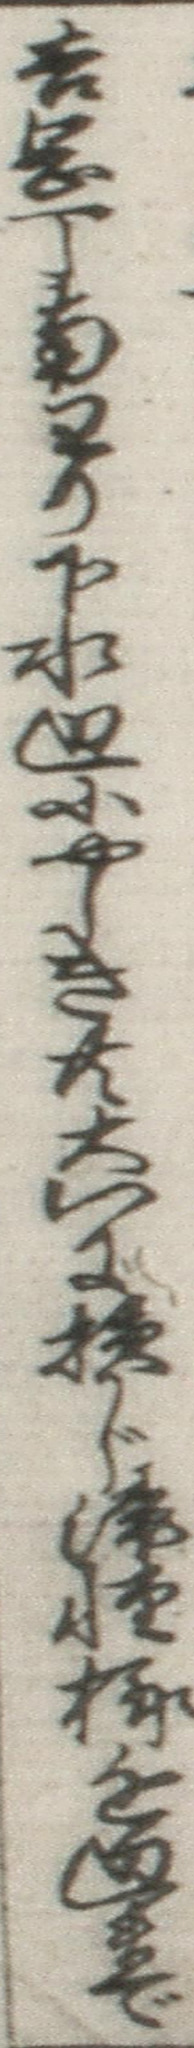吉岡丁南わり下水辺小やしき共大いに損じ津軽様近辺まで

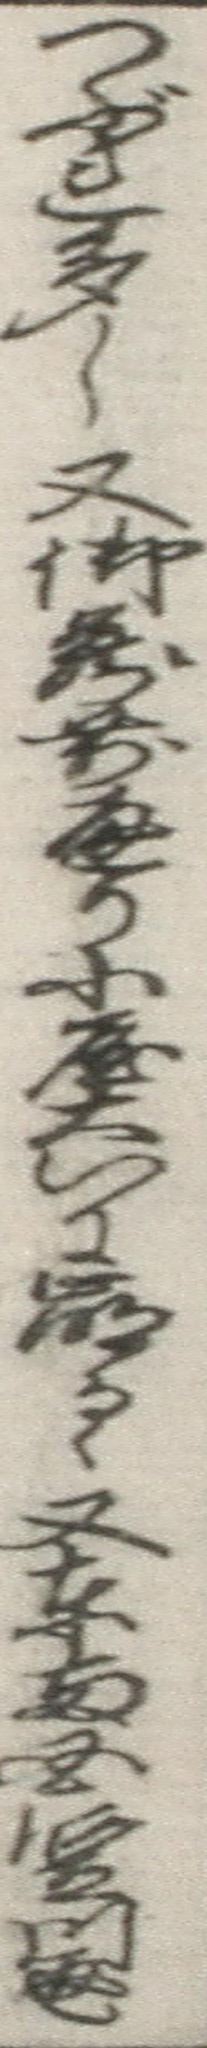つぶれ多し又御蔵前通り小屋大いに崩るゝ又東両国堅川通
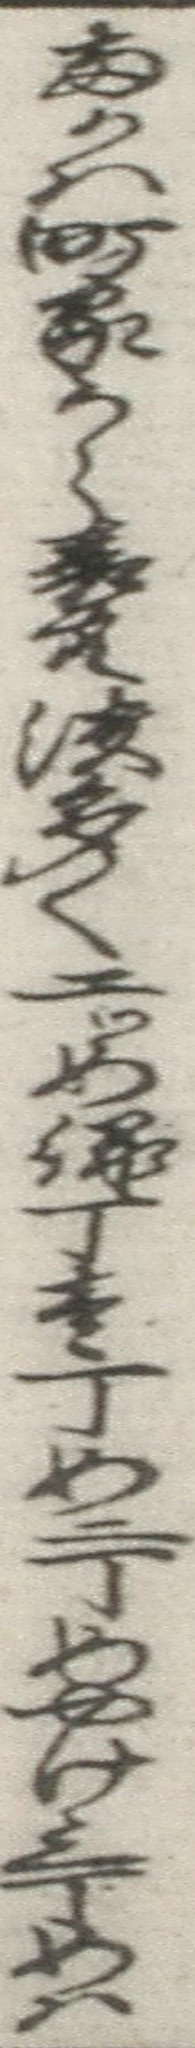両かは町家うら表共潰多く二ツめ緑丁壱丁め二丁めやけ三丁めは
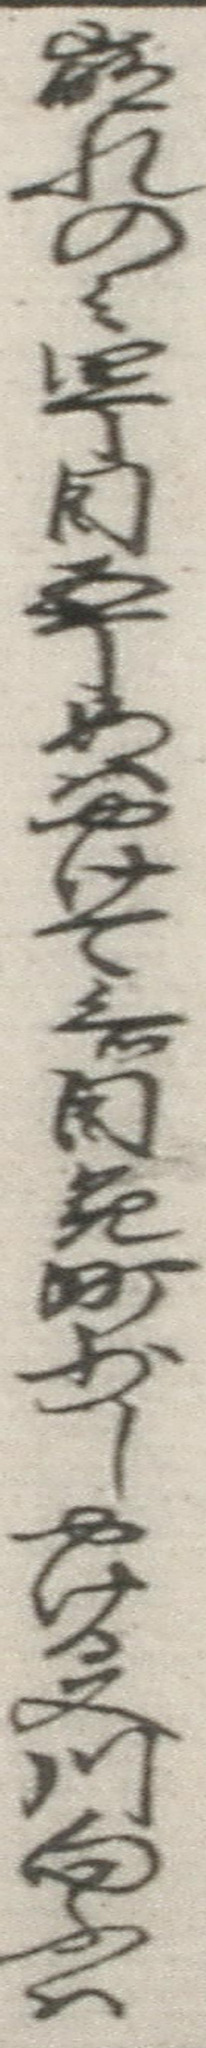崩れのみ四丁目五丁めはやけて三ツ目花町少しやける又川向ふは
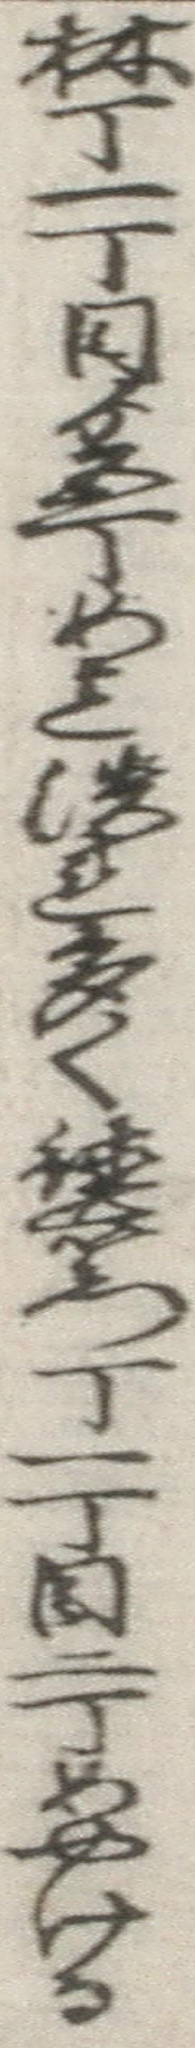林丁一丁目ゟ五丁め迄潰多く徳右衛門丁一丁目二丁めやける
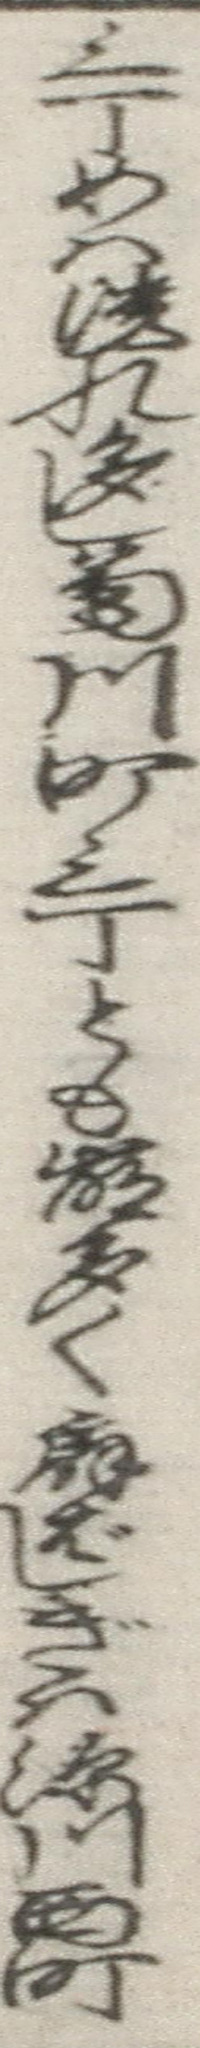三丁めは潰れ多し菊川町三丁とも崩多く扇ばしぎは深川西町
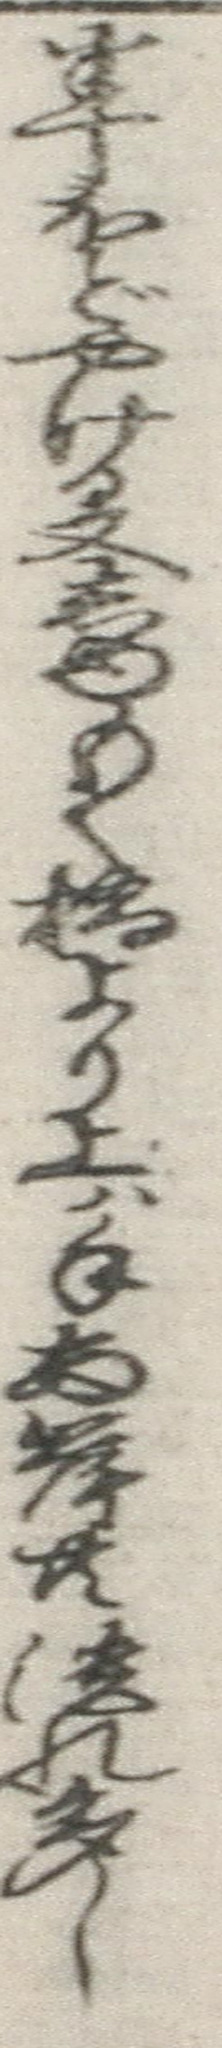半丁ほどやける又しゆもく橋より上ハ手両岸共潰れ多し
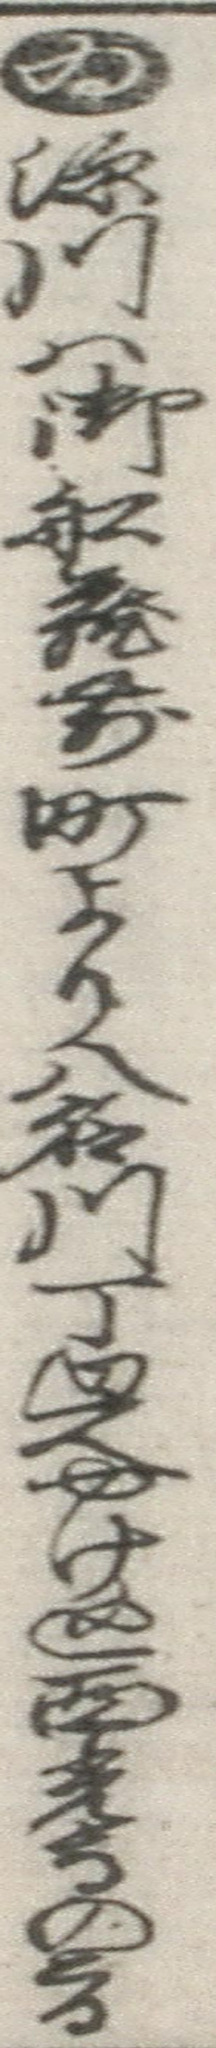ゐ深川は御船蔵前町より八名川丁辺へやけ込西光寺のこる
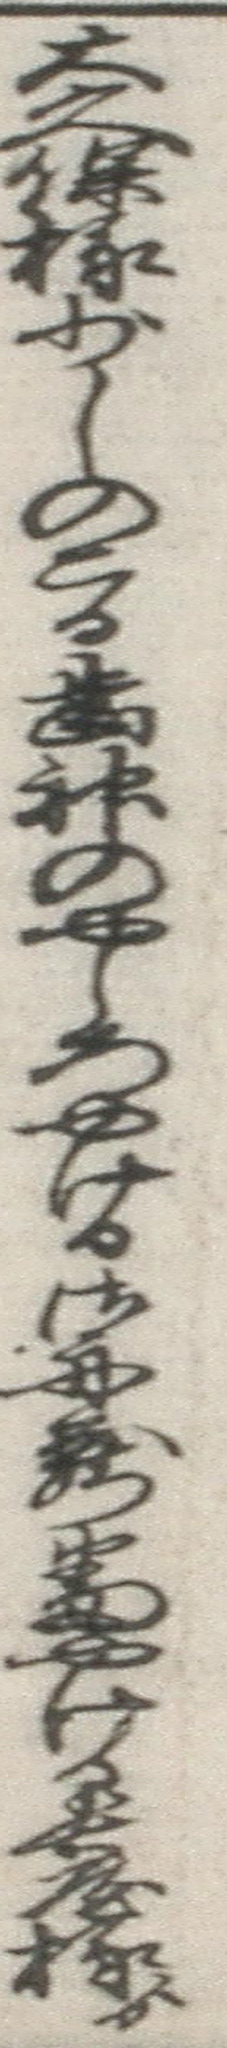大久保様少しのこる歯神のやしろやける御舟蔵番やける長屋様ゟ
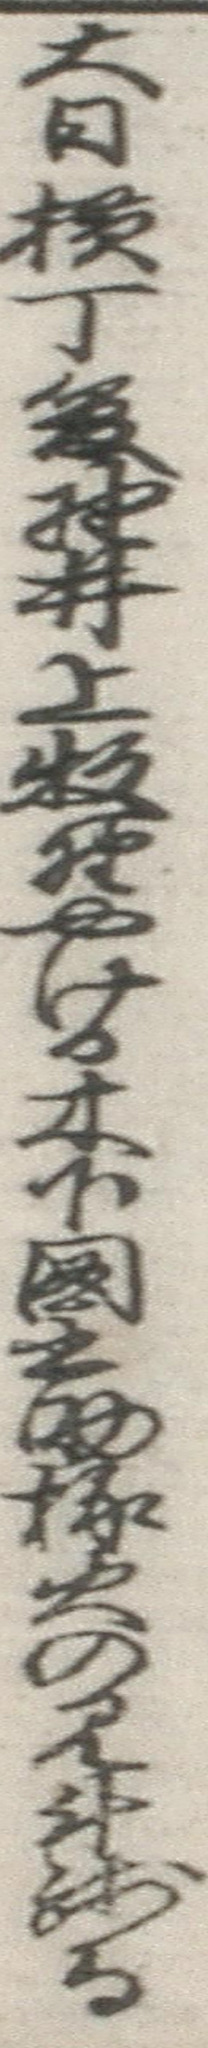大日横丁菅野井上牧野やける木下図書助様火の見計残る
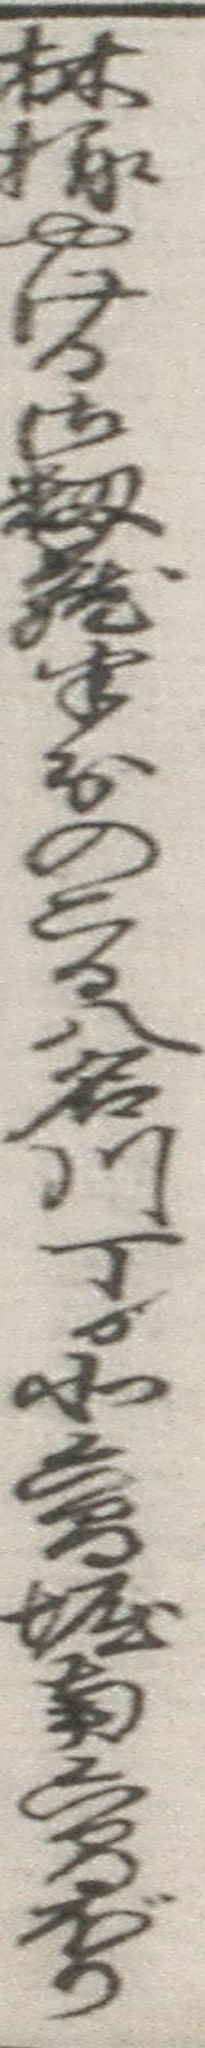林様やける御籾蔵半分のこる八名川丁ゟ北六間堀南六間ぼり
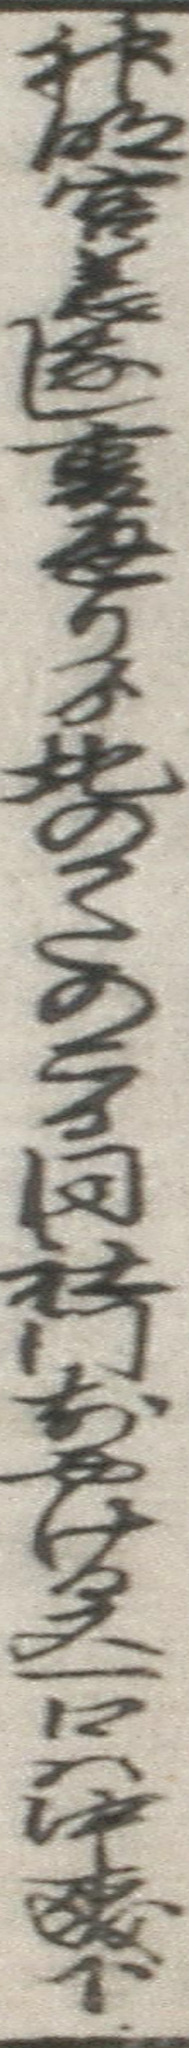神明宮恙なし裏通りゟ北のかたのこる同社門前やける又一口は中森下
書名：大地震焼場細見記
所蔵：東京大学地震研究所図書室 Earthquake Research Institute Library, The University of Tokyo, JAPAN
